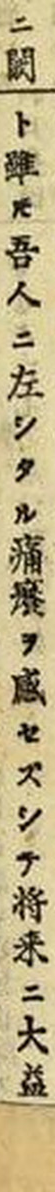ト雖𪜈吾人ニ左シタル痛療ヲ感セズシテ將来ニ大益
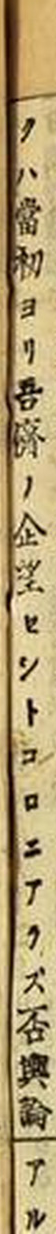クハ當初ヨリ吾儕ノ企望セシトコロニアラズ否興論
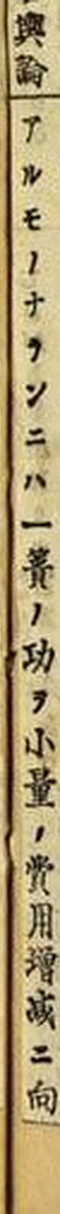アルモノナランニハ一責ノ功ヲ少量ノ費用増減ニ向
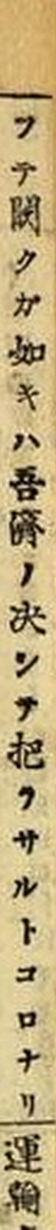フテ闕クガ如キハ吾儕ノ決シテ把ラサルトコロナリ
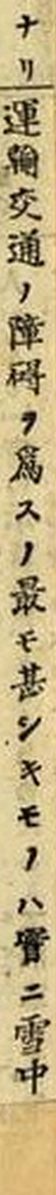運輸交通ノ障碍ヲ爲スノ最モ甚シキモノハ實ニ雪中
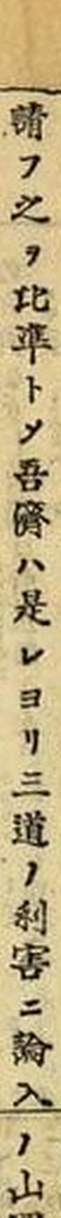請フ之ヲ比準ト乄吾儕ハ是レヨリ三道ノ利害ニ論入
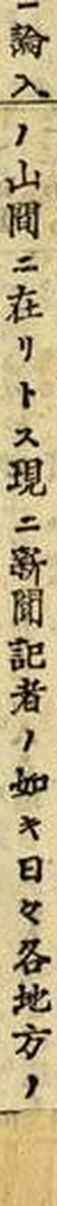ノ山間ニ在リトス現ニ新聞記者ノ如キ日々各地方ノ
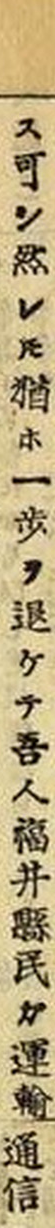ス可シ然レ𪜈猶ホ一歩ヲ退ケテ吾人福井縣民ガ運輸
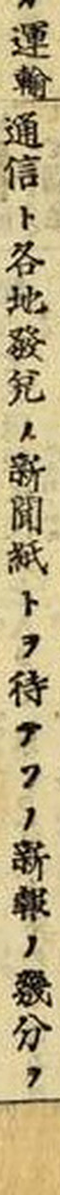通信ト各地發兌ノ新聞紙トヲ待テソノ新報ノ幾分ヲ
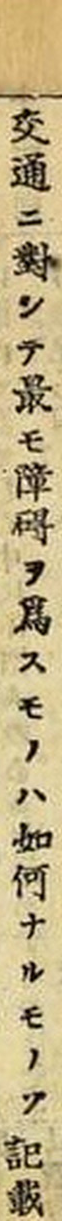交通ニ對シテ最モ障碍ヲ爲スモノハ如何ナルモノソ
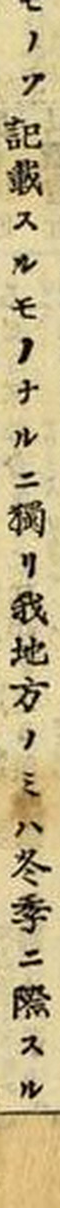記載スルモノナルニ獨リ我地方ノミハ冬季ニ際スル
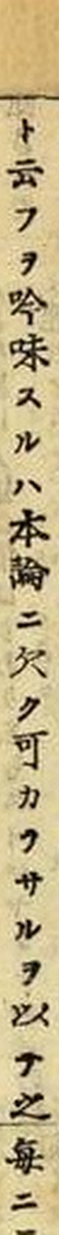ト云フヲ吟味スルハ本論ニ欠ク可カラサルヲ以テ之
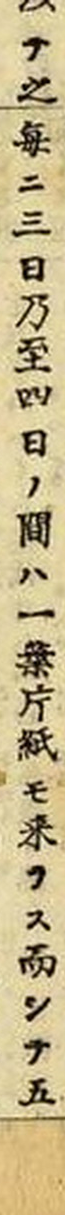毎ニ三日乃至四日ノ間ハ一葉片紙モ来ラス而シテ五
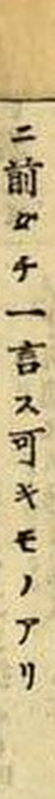ニ前ダチ一言ス可キモノアリ
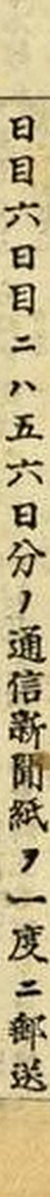日目六日目ニハ五六日分ノ通信新聞紙ヲ一度ニ郵送
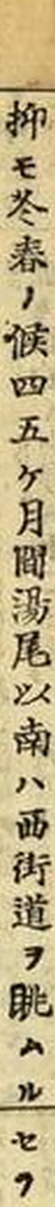抑モ冬春ノ候四五ケ月間湯尾以南ハ西街道ヲ眺ムル
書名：温古集 五巻
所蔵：福井県文書館 Fukui Prefectural Archives
